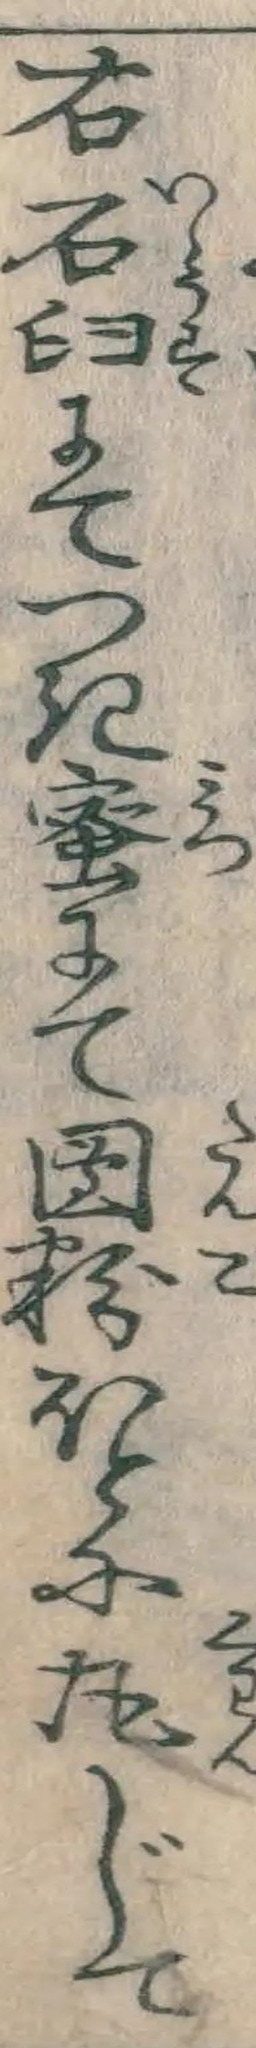右石臼にてつき蜜にて団粉ほとに丸じて

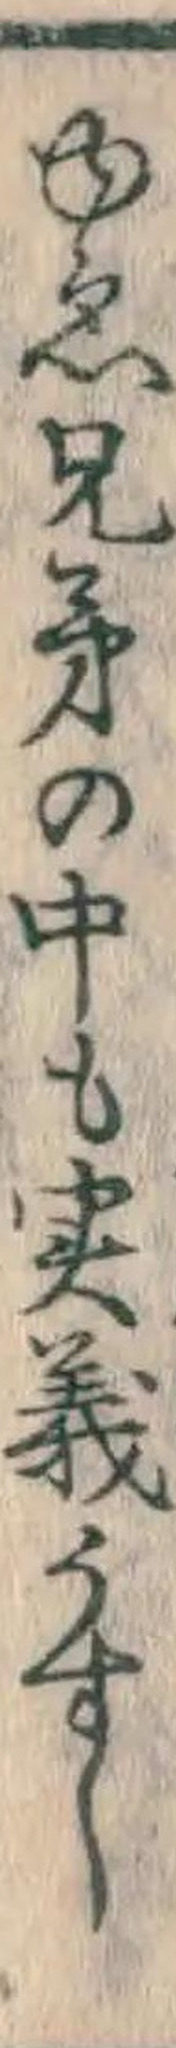ゆゑ兄弟の中も実義うすし
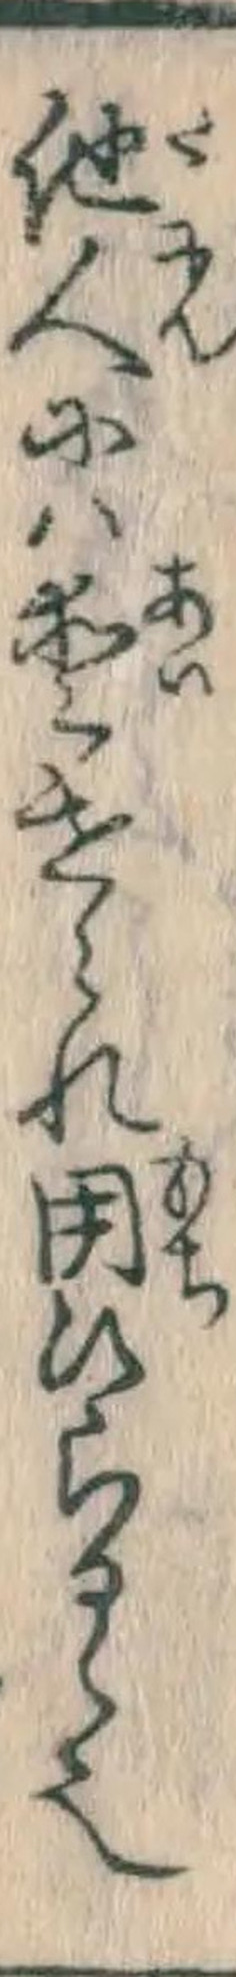他人には愛せられ用ひらるゝ也
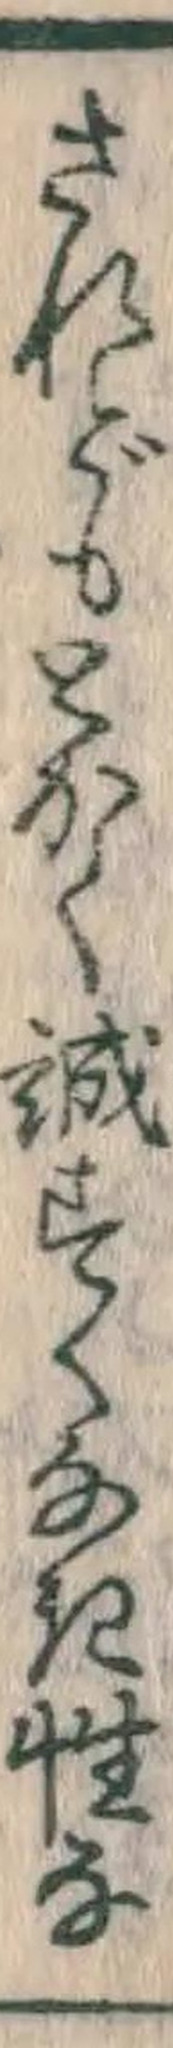されどもとかく誠すくなき性な
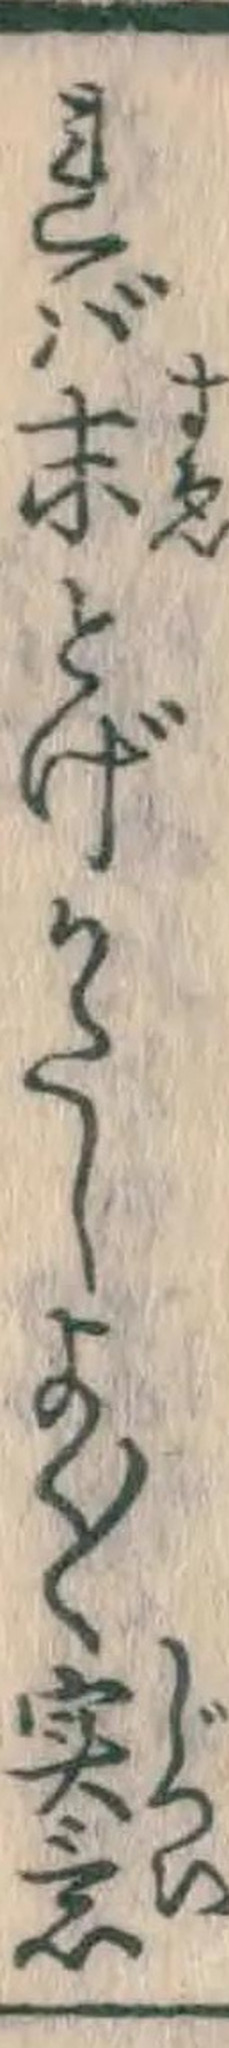れば末とげかたしよく〳〵実意
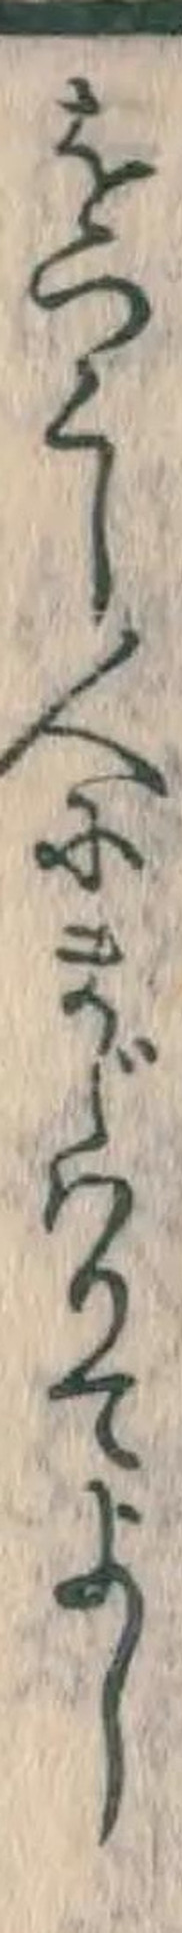をつくし人にまじはりてよし
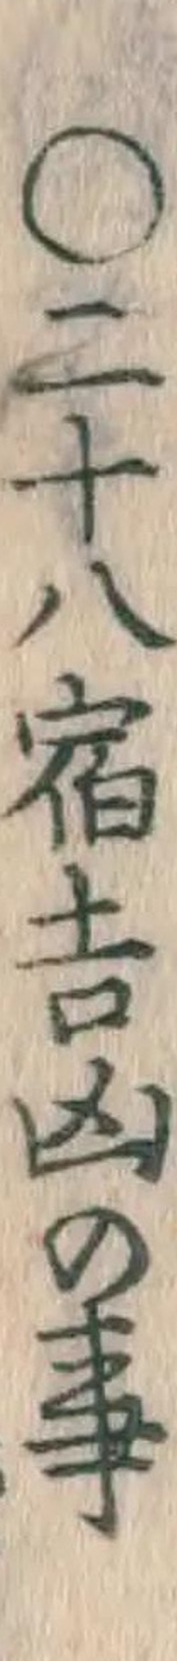○二十八宿吉凶の事
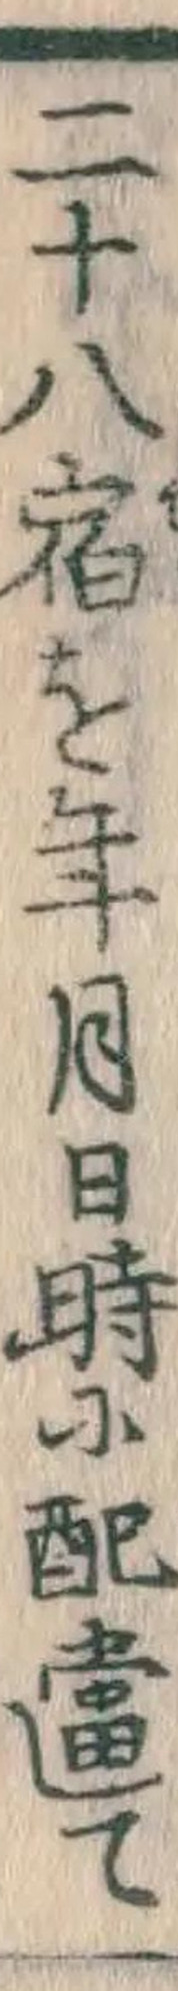二十八宿を年月日時に配当して
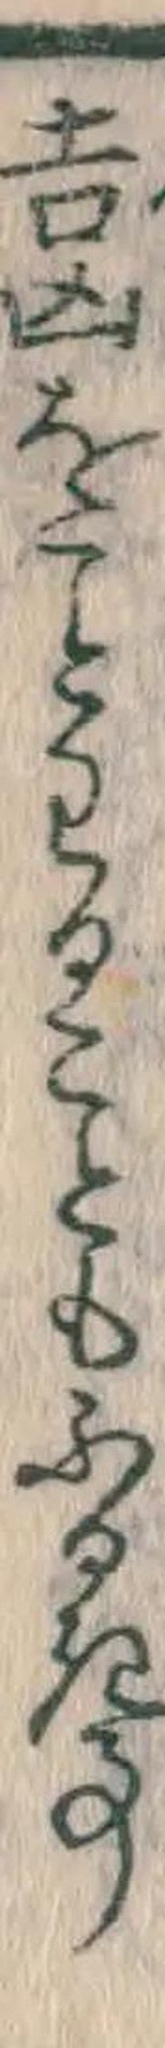吉凶をことわることもふるき事
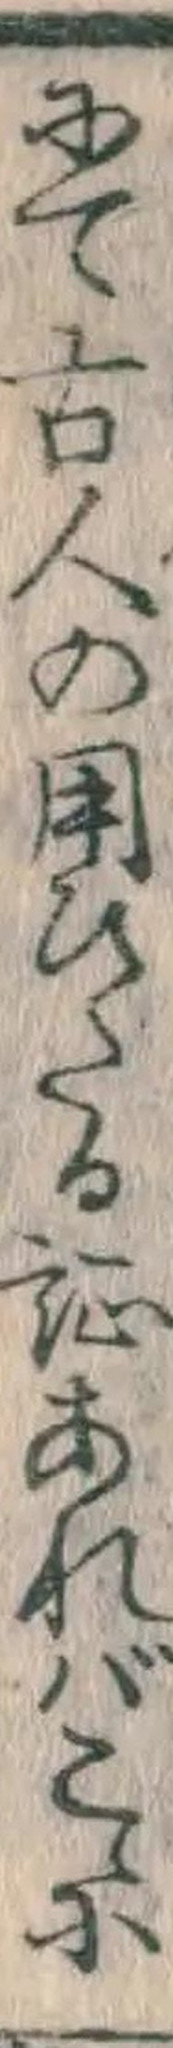にて古人の用ひたる証あればこゝに
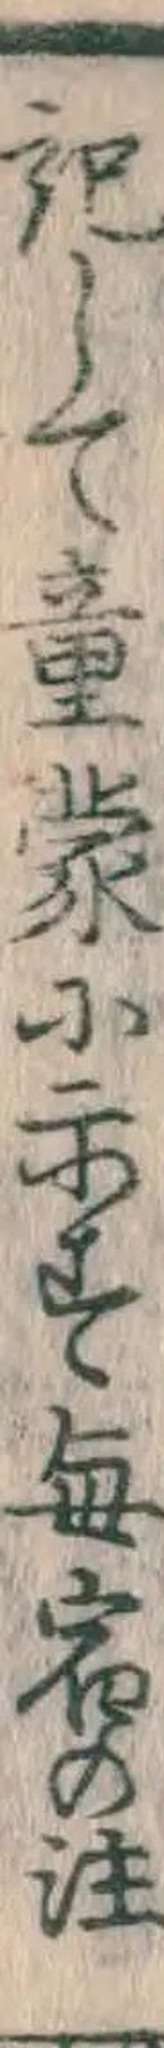記して童蒙に示す毎宿の注
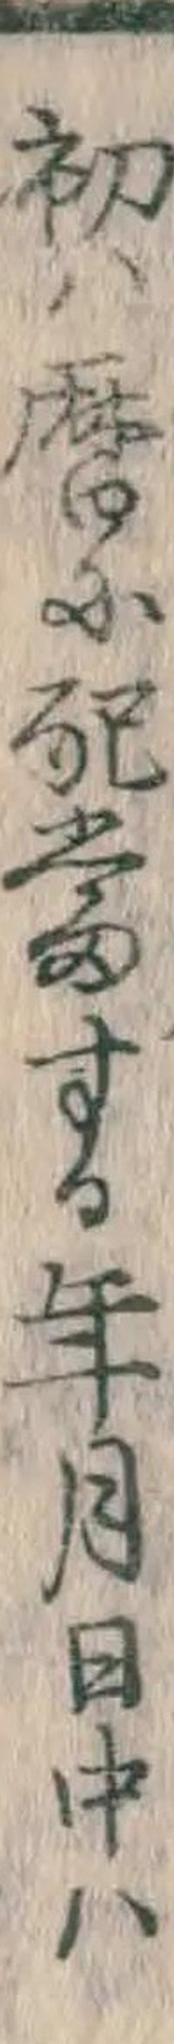初は暦に配当する年月日中は
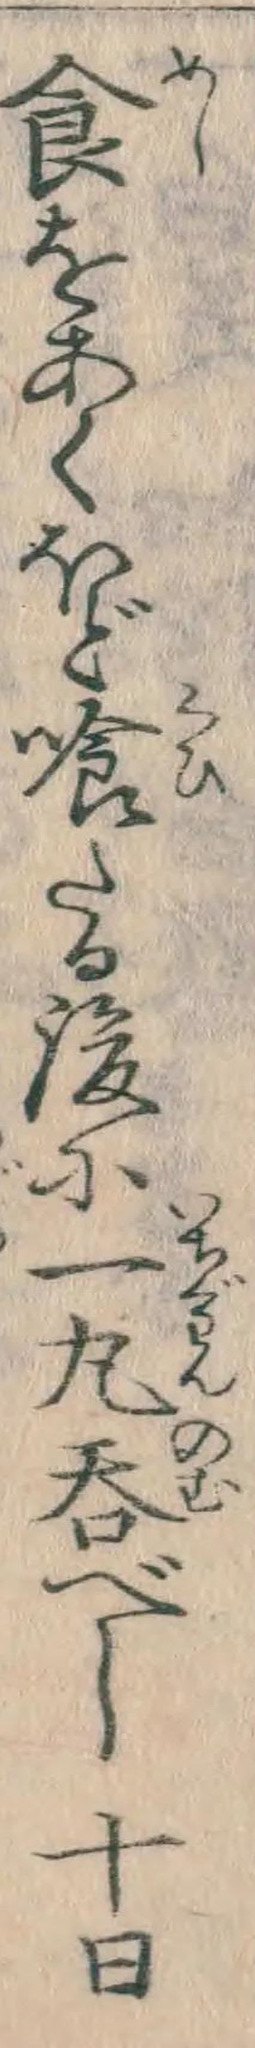食をあくほど喰たる後に一丸呑べし十日
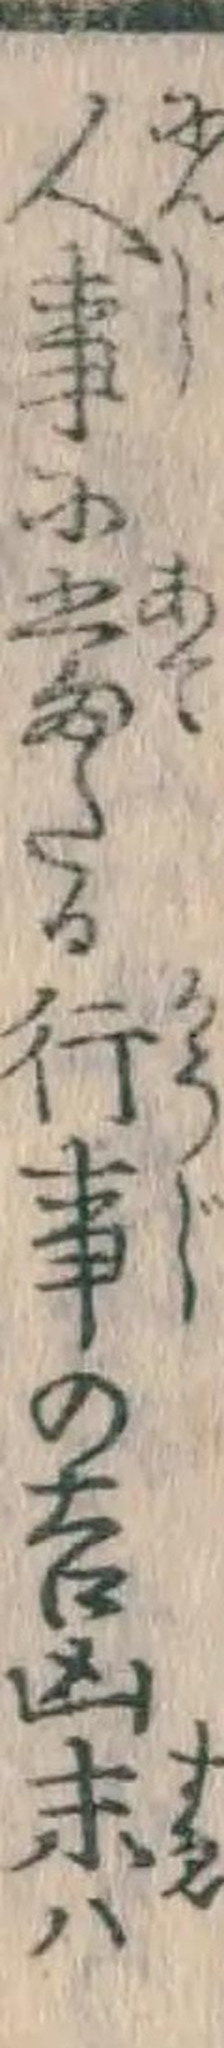人事に当たる行事の吉凶末は
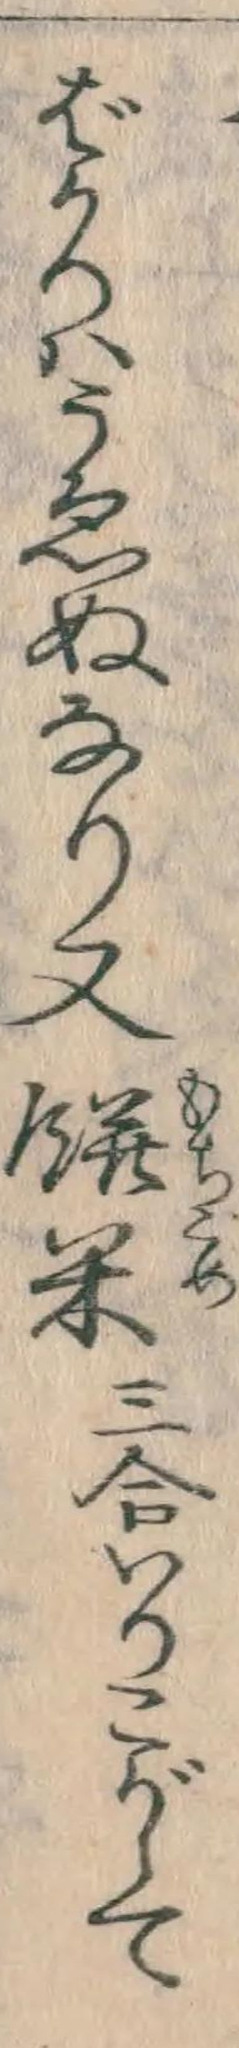ばかりはうゑぬなり又餅米三合いりこがして
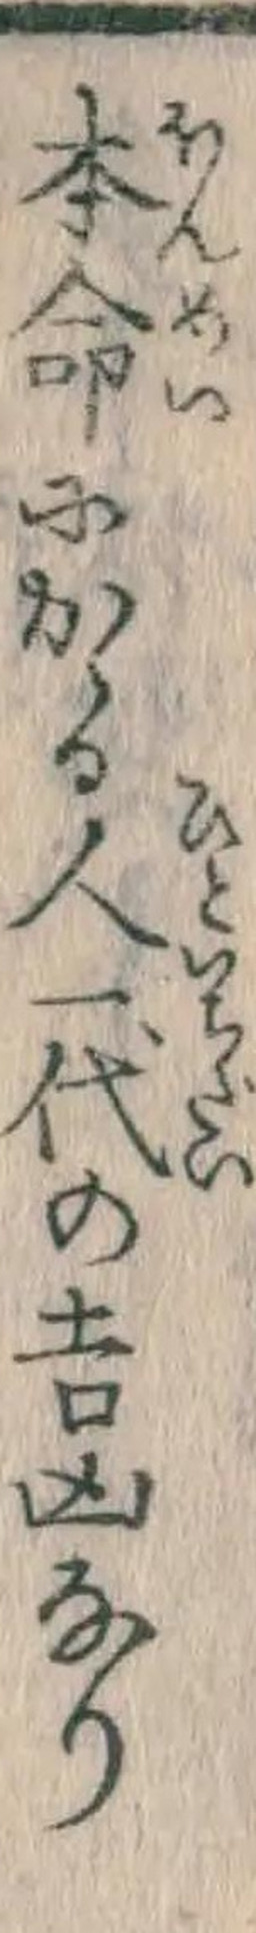本命にかゝる人一代の吉凶なり
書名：広益秘事大全 3巻. [2]
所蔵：国立国会図書館 National Diet Library, JAPAN
